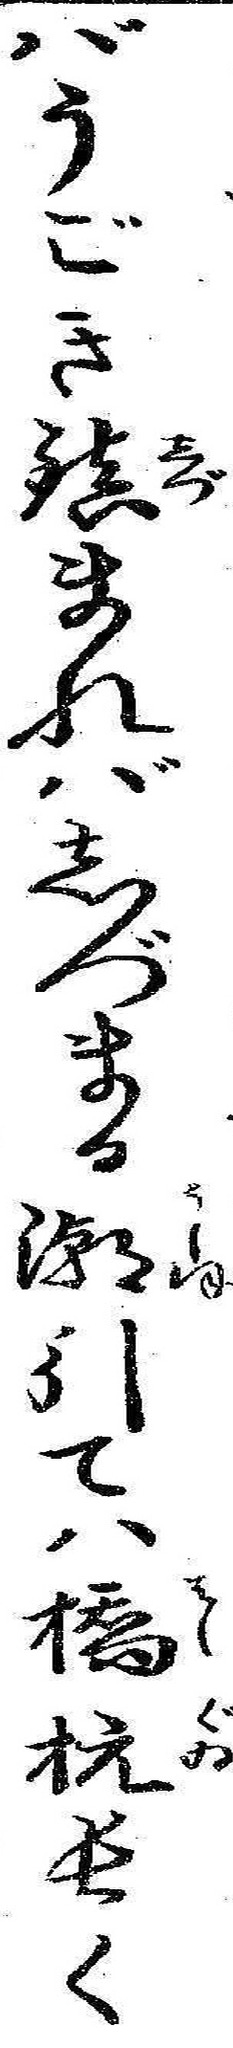ばうごき鎮まればしづまる潮引ては橋杭長く
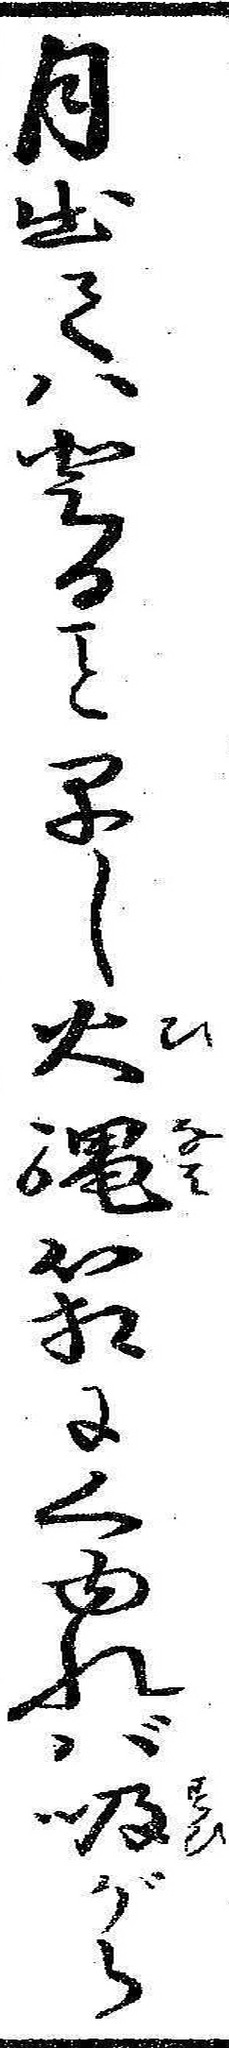月出ては登ること早し火縄箱にくゆれば吸がら
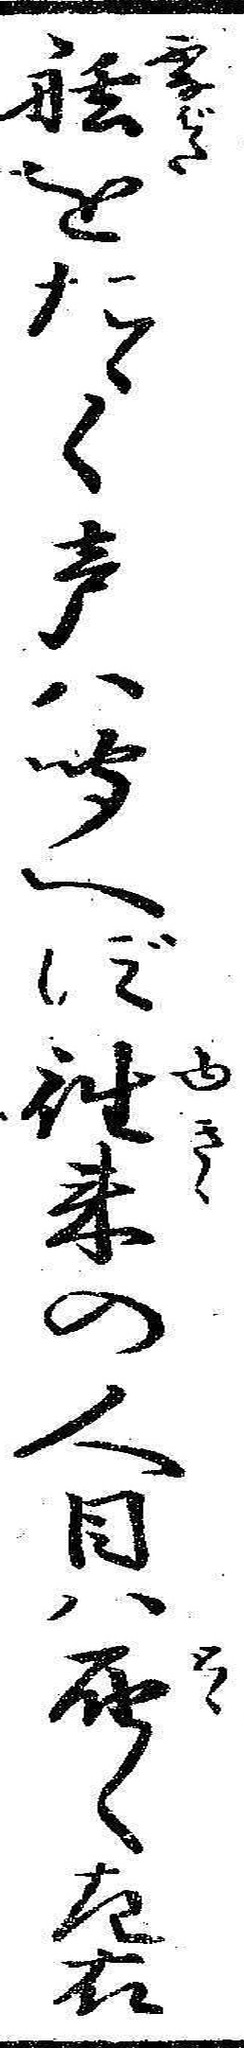舷をたゝく声は聞へず往来の人目は届く左右
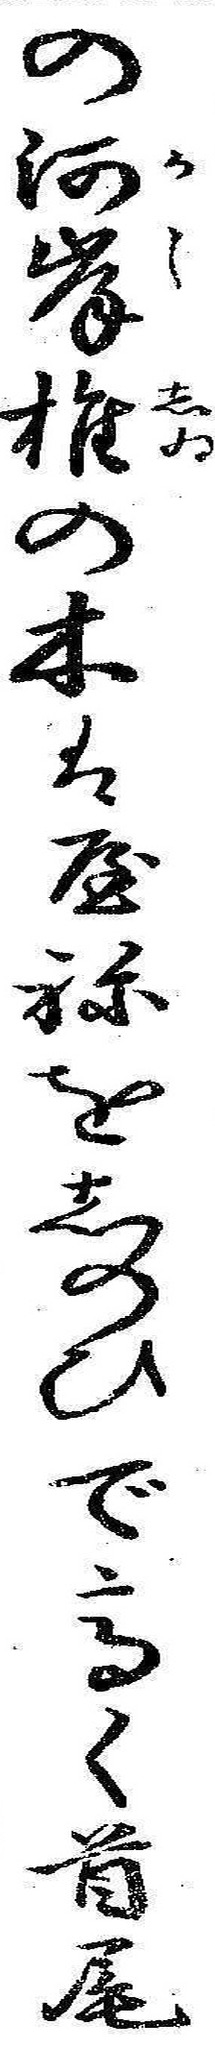の河岸椎の木は屋根をしのひで高く首尾
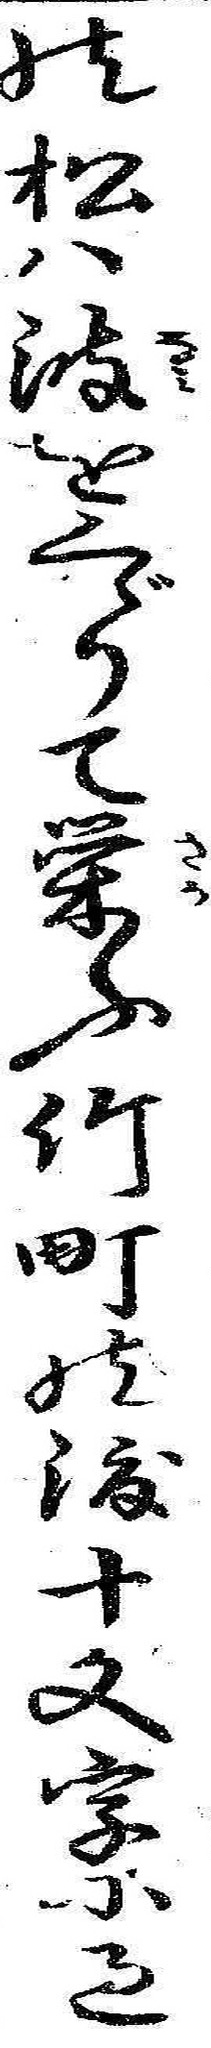の松は波をくゞりて栄ふ竹町の渡十文字に過
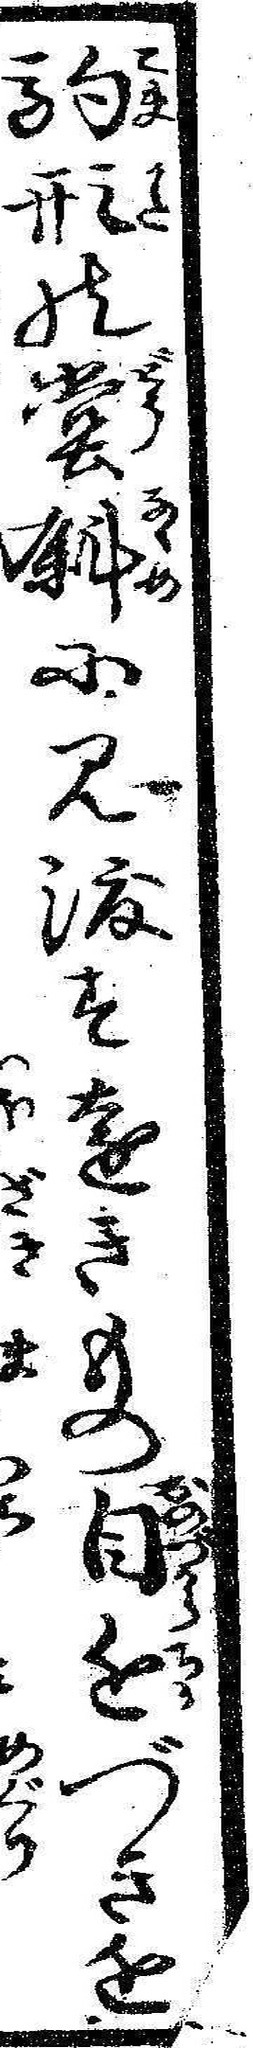駒形の堂斜に見渡す遠きもの自近づき近
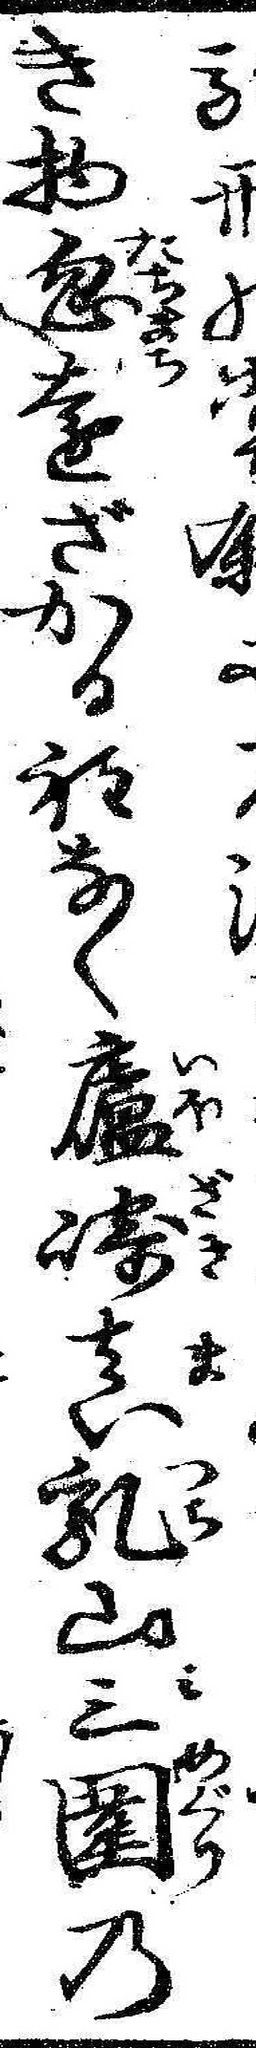き物忽遠ざる程なく盧崎真乳山三圍の
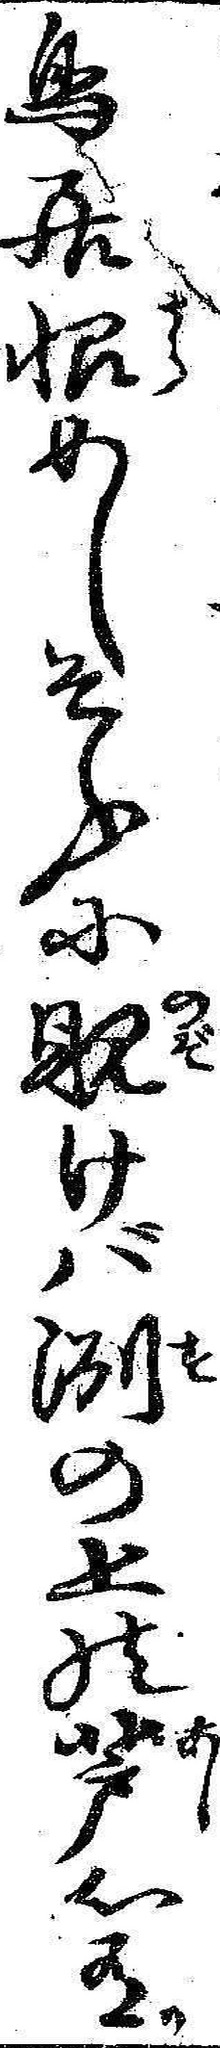鳥居恨めしそふに覗けば洲の上の葦心有
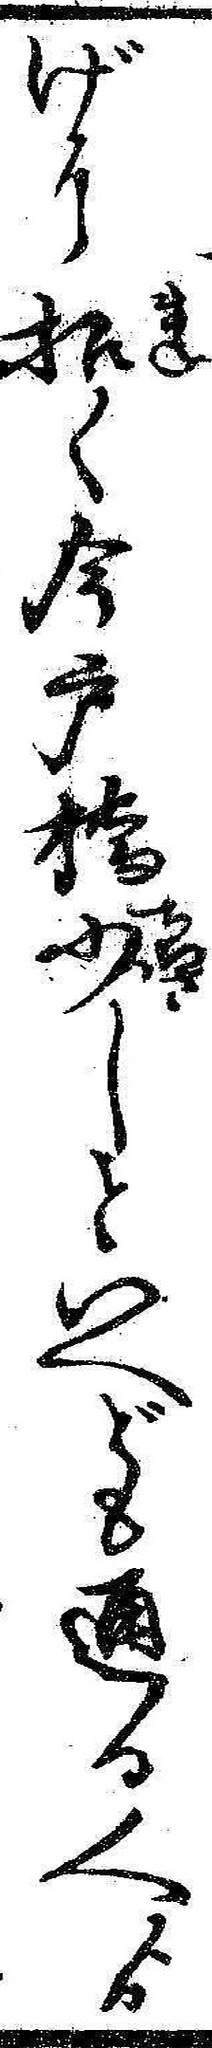げに招く今戸橋少しといへども通る人ゟ
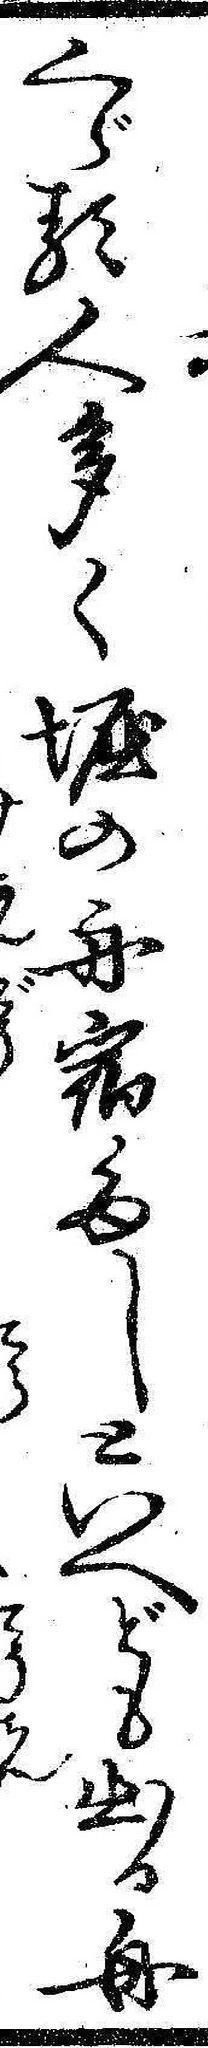くゞる人多く堀の舟宿多しといへども出る舟
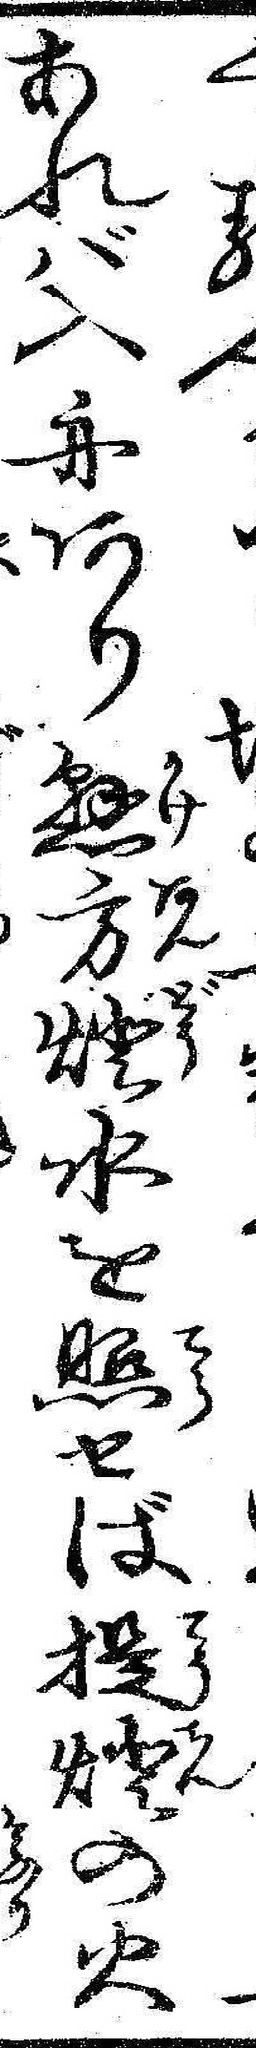あれば入舟あり懸方燈水を照せば提燈の火
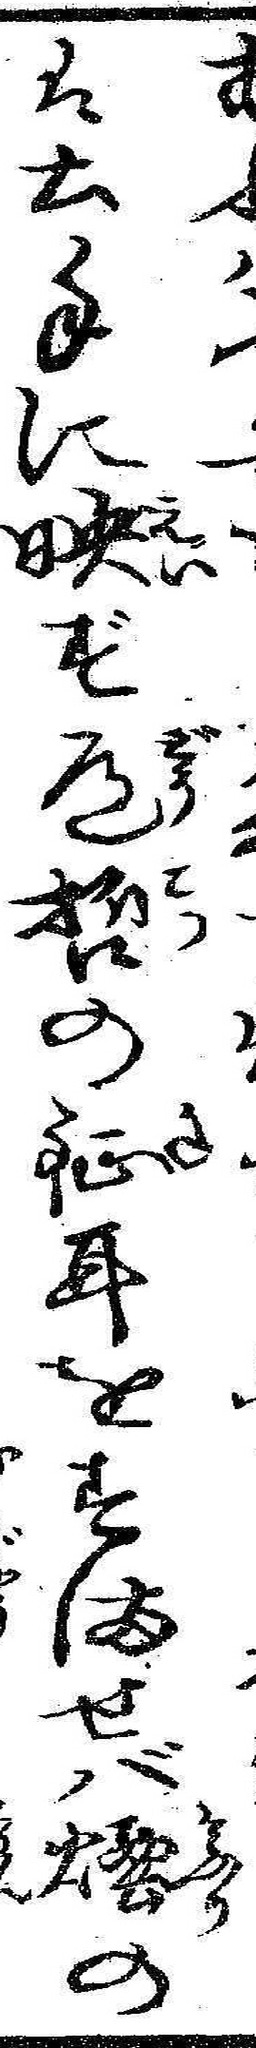は土手に映ず道哲の鉦耳をすませば煙の
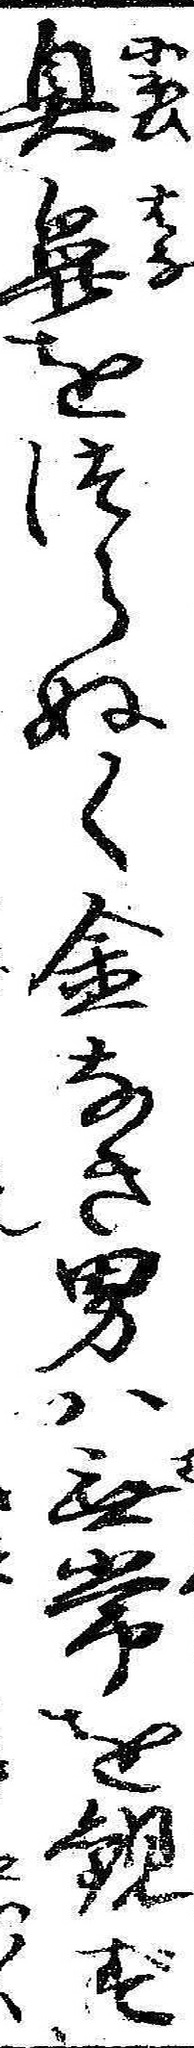臭鼻をつらぬく金なき男は無常を観ず
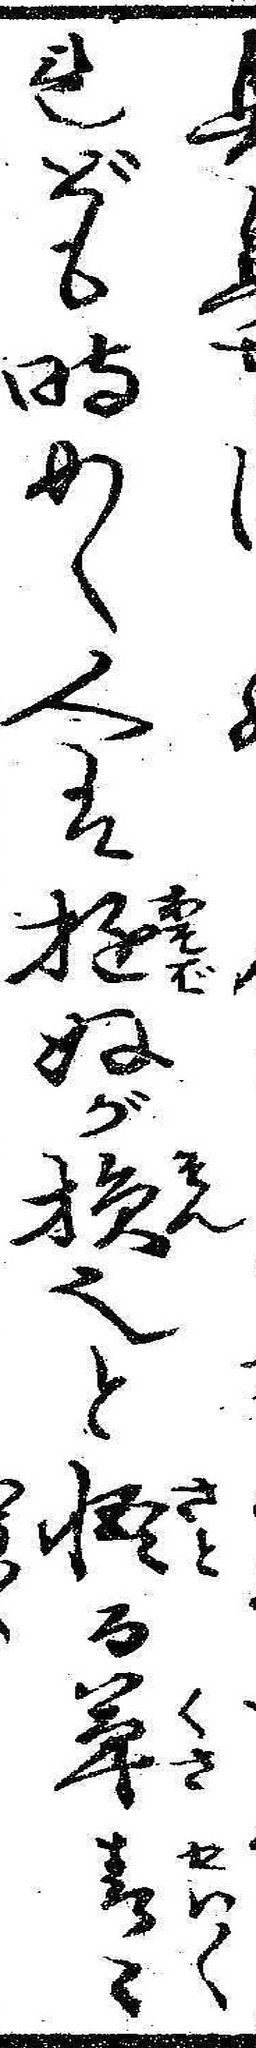れども時めく人は遊ぬが損也と悟る草青々
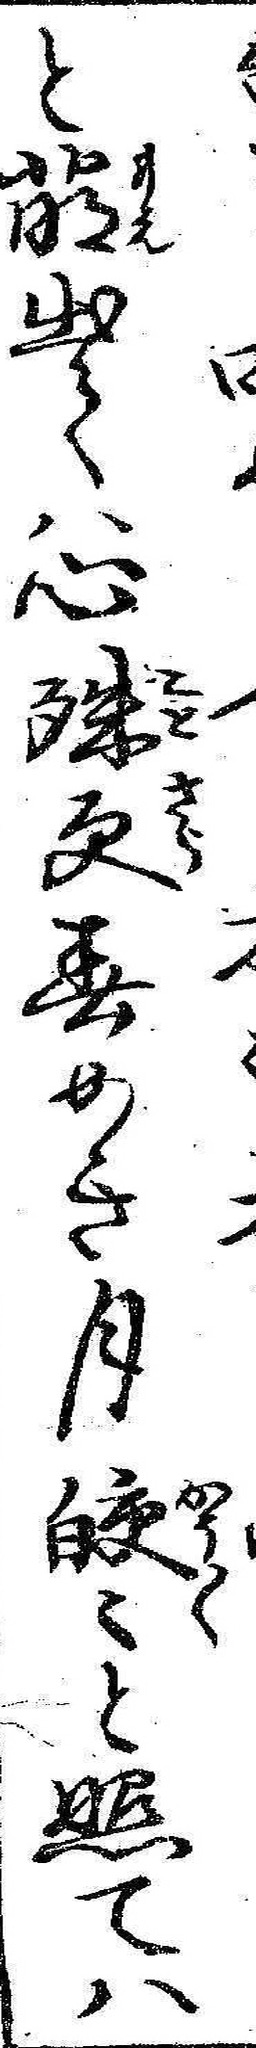と萌出ては心殊更春めき月咬々と照ては

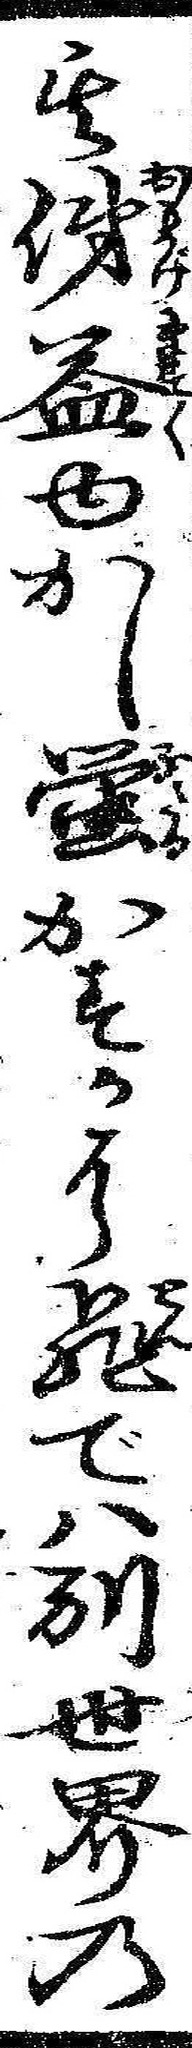其俤益ゆかし蛍かすかに飛では別世界の
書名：根無草後編
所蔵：国文学研究資料館
